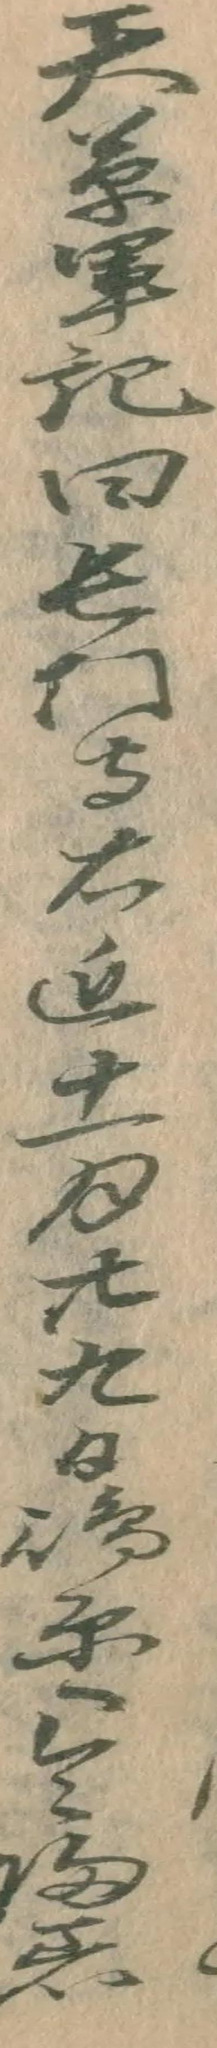天草軍記曰長門守右近十一月廿九日島原へ令帰着
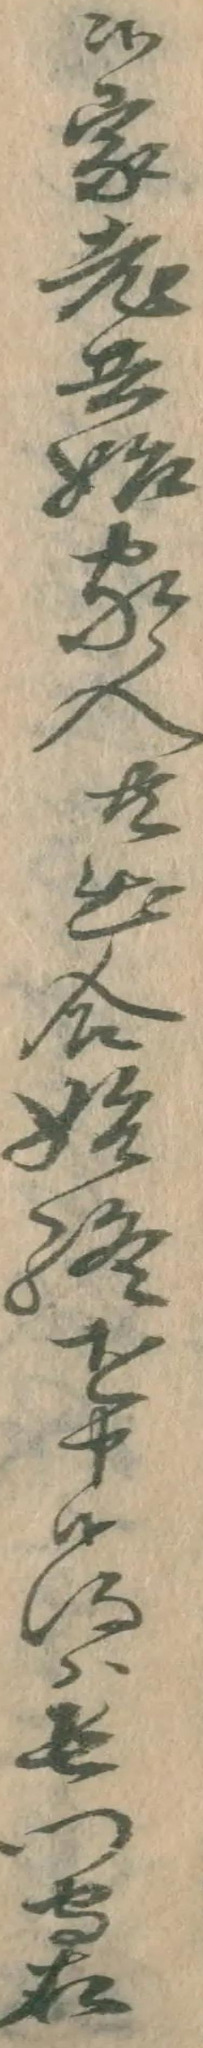候家老共始家人共出合始終を申候得は長門守右
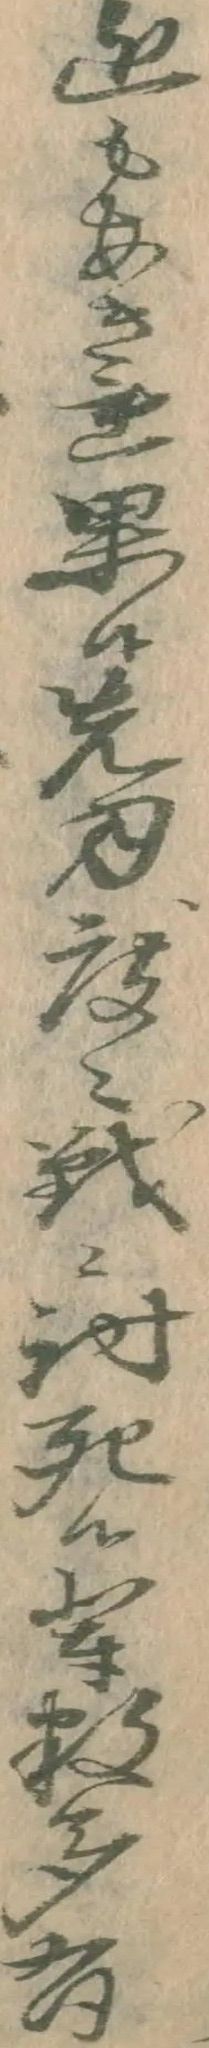近もあきれ果候先月度々戦に討死候輩数多有
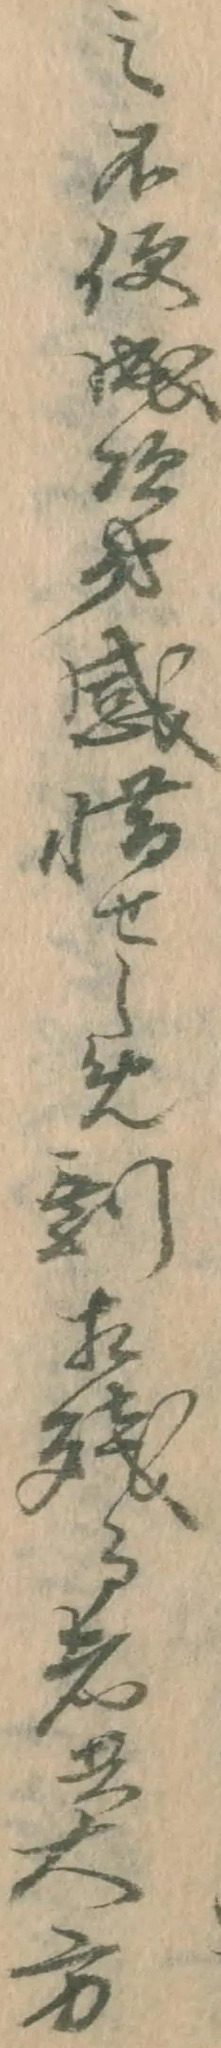之不便成次第感惜せしめ到相残る者共大方

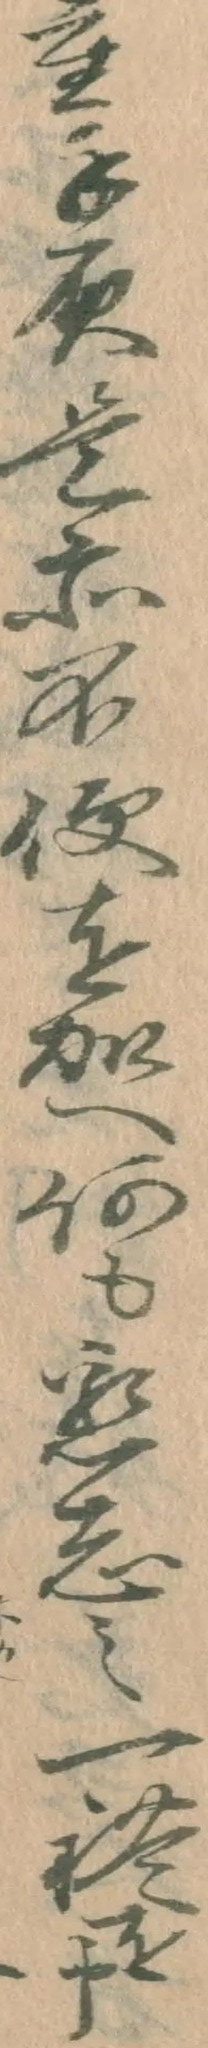重手負是所不便を加へ何も懇志之一礼を申
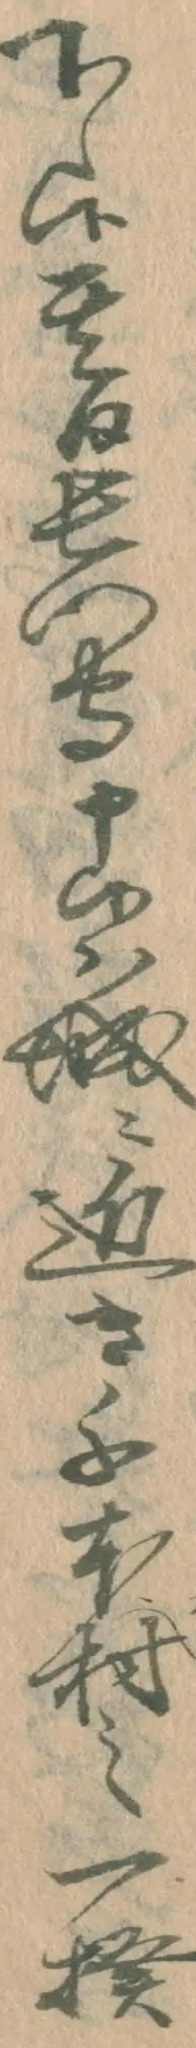下候其日長門守申候は城に近き千本村之一揆
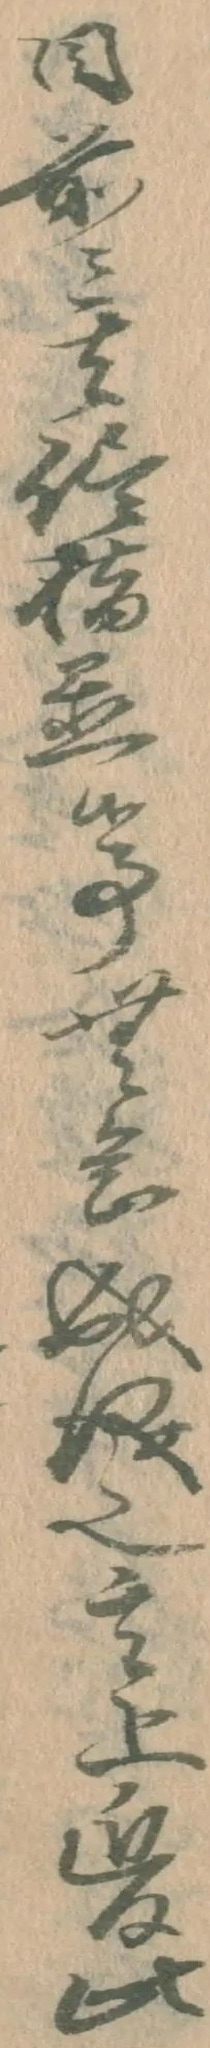目前に其儘指置候事無念成儀也其上近日此
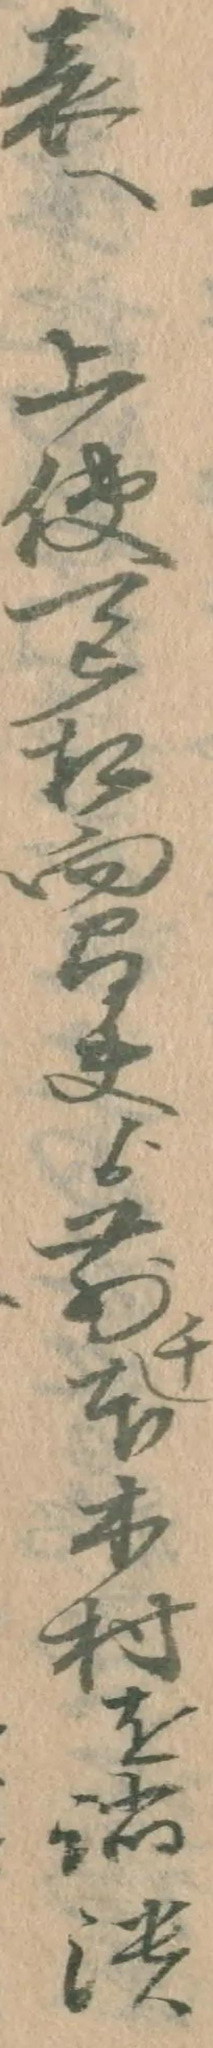表へ上使可被相向間夫ゟ前本木村を踏潰
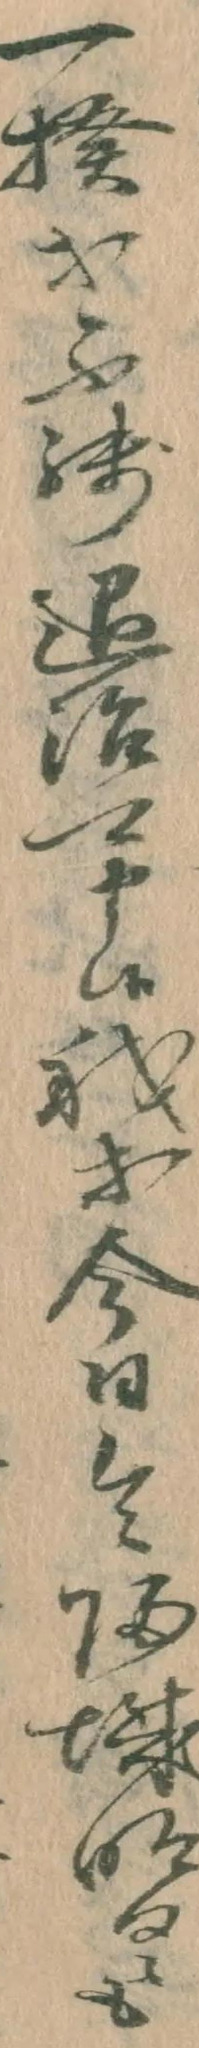一揆等不残退治可申候我等今日令帰城明日にも
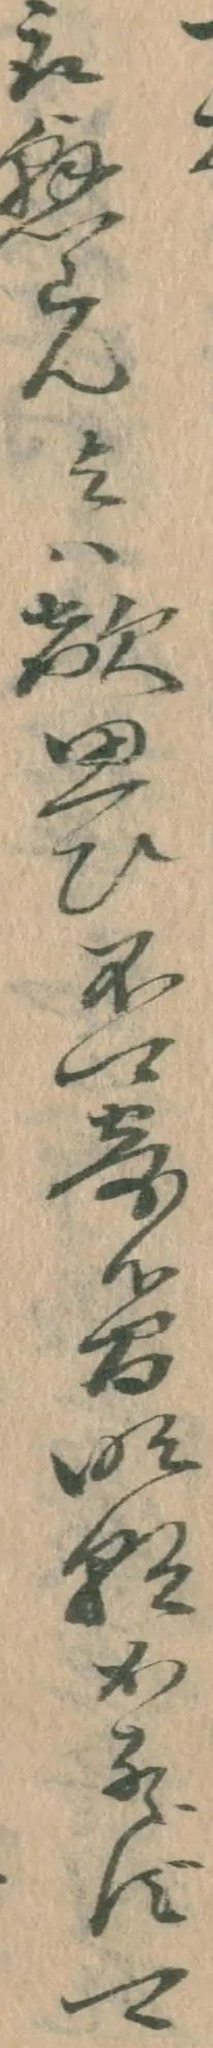取懸らんとは敵思ひ不可寄候間明朝かならず可
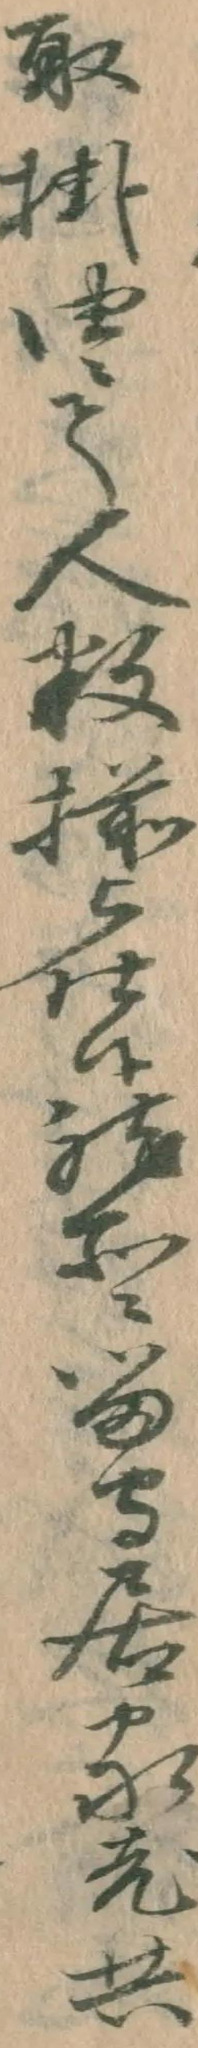取掛由にて人数揃被仕候然所に留守居家老共
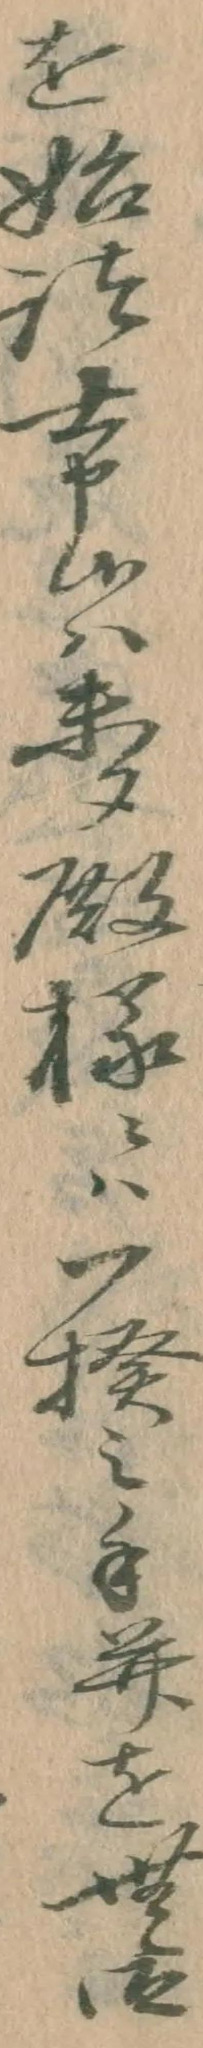を始諸士申候は未た殿様には一揆の手并を無御
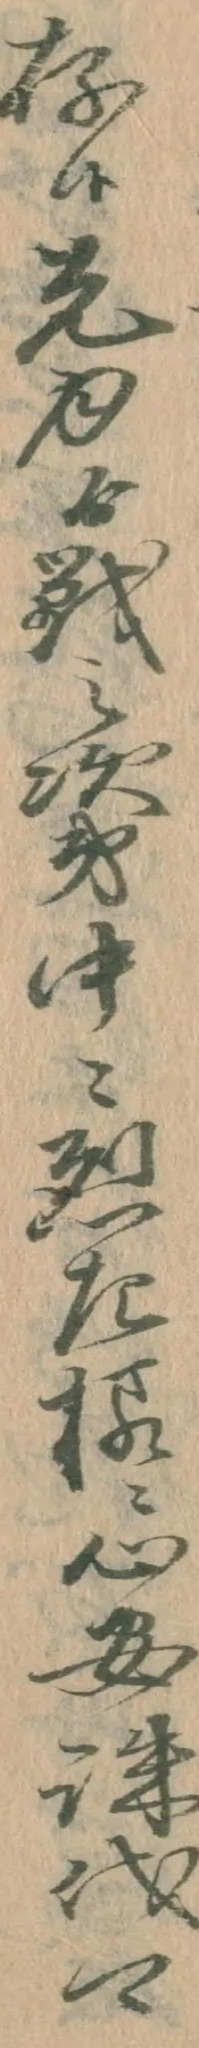存候先月ゟ戦之次第中々烈左様に心安誅伐可
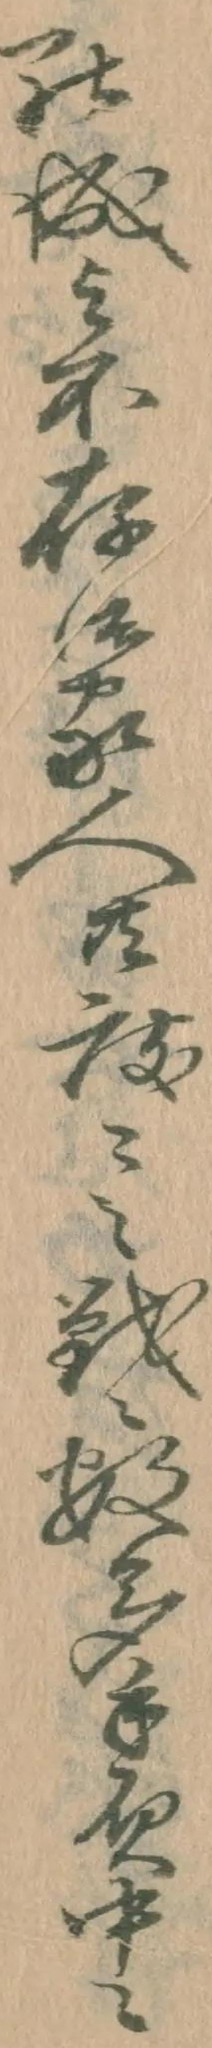罷成と不存御家人共度々之戦に数多手負中々
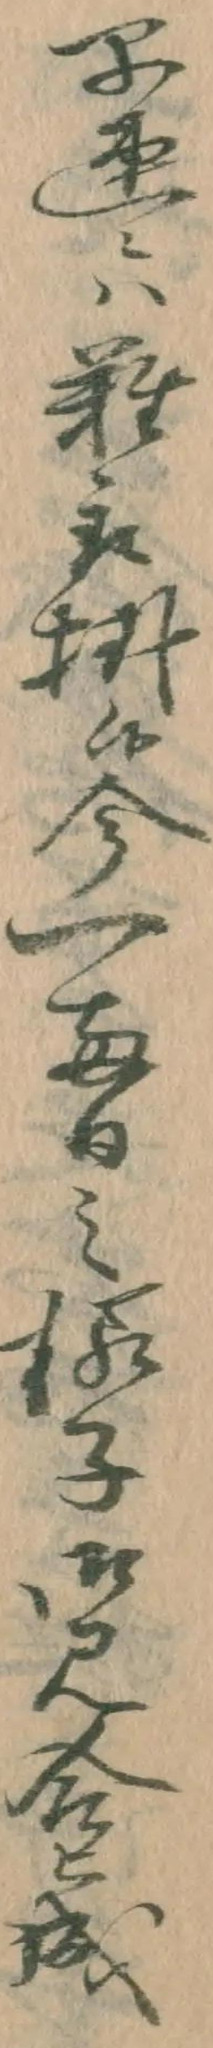早速には難取掛候今一両日之様子御見合被成
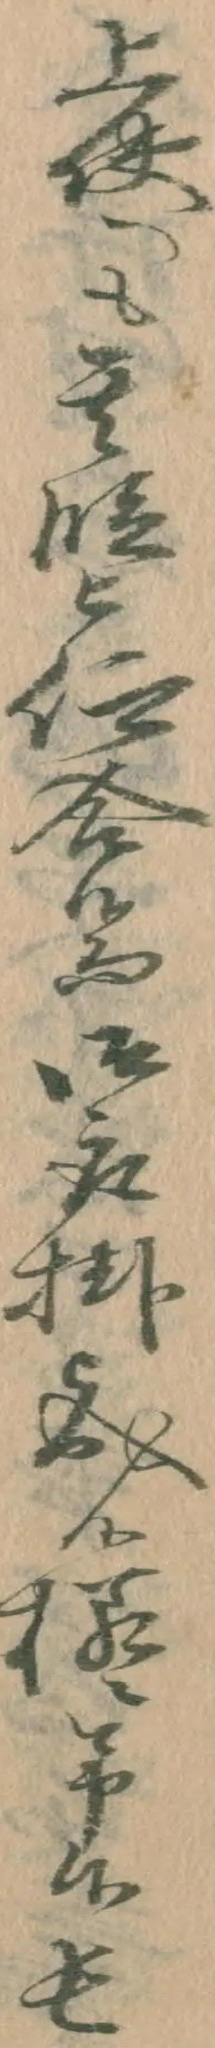上使へも其段被仰合候而御取掛被成候様にと申候長
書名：切支丹御退治記 49巻. [3]
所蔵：国立国会図書館 National Diet Library, JAPAN
